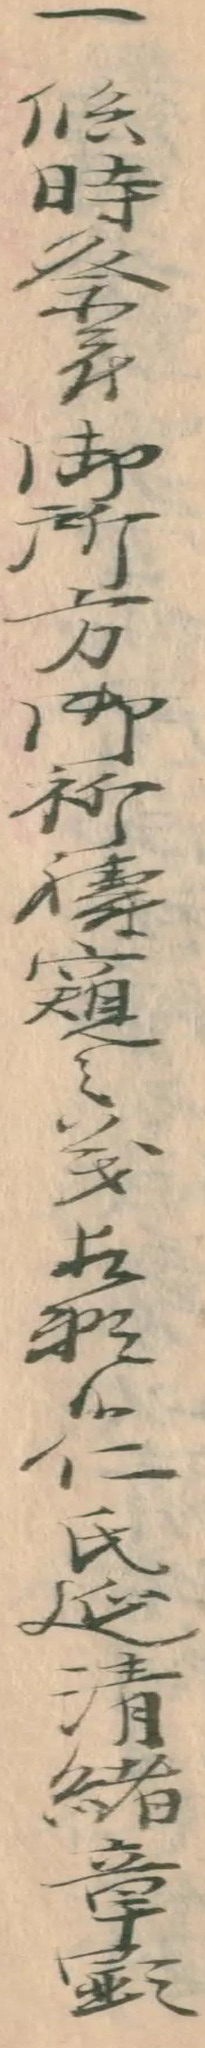一臨時祭ニ付御所方御祈祷窺之義相頼候仁氏延清緒章顕
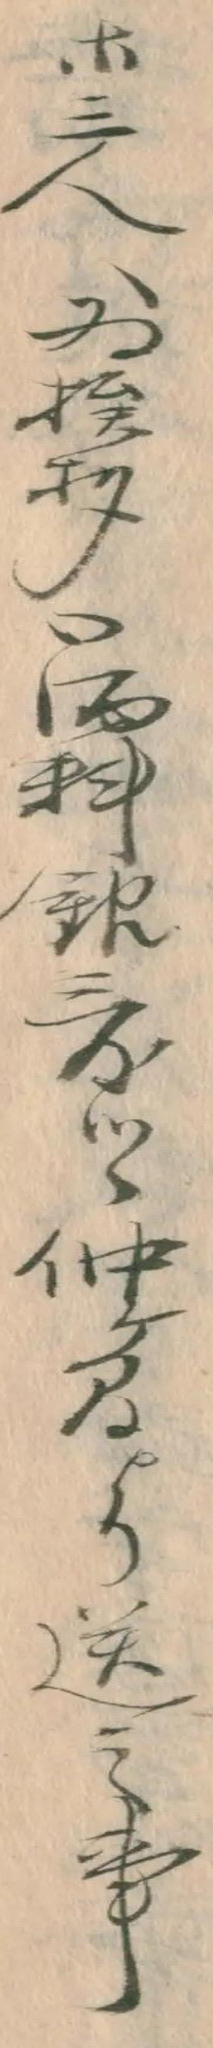等三人へ為挨拶御酒料銀三貫ツヽ仲ケ間より送之事
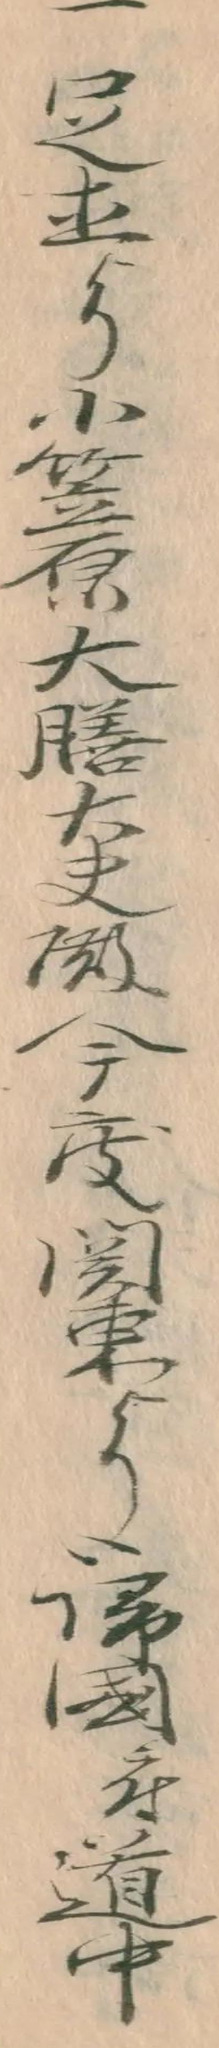一足直より小笠原大膳大夫殿今度関東より御帰國ニ付道中
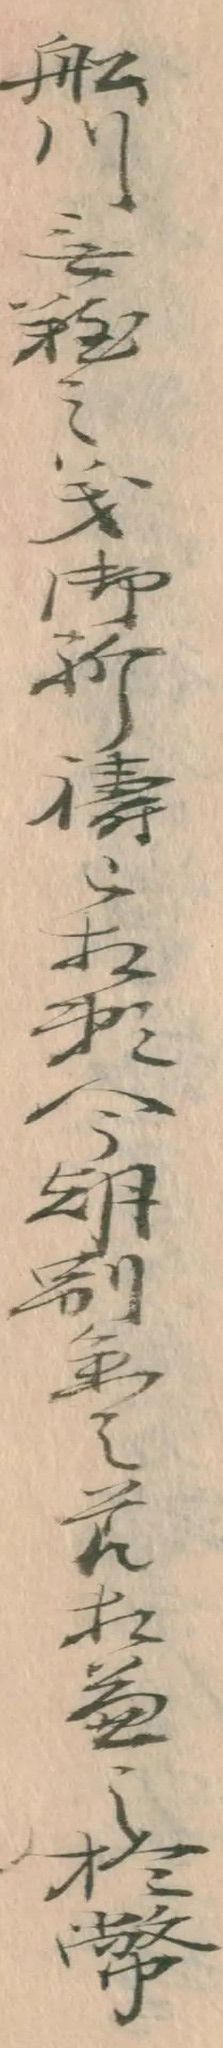舩川無程之義御祈祷被相頼今朝別参之節相兼也於幣
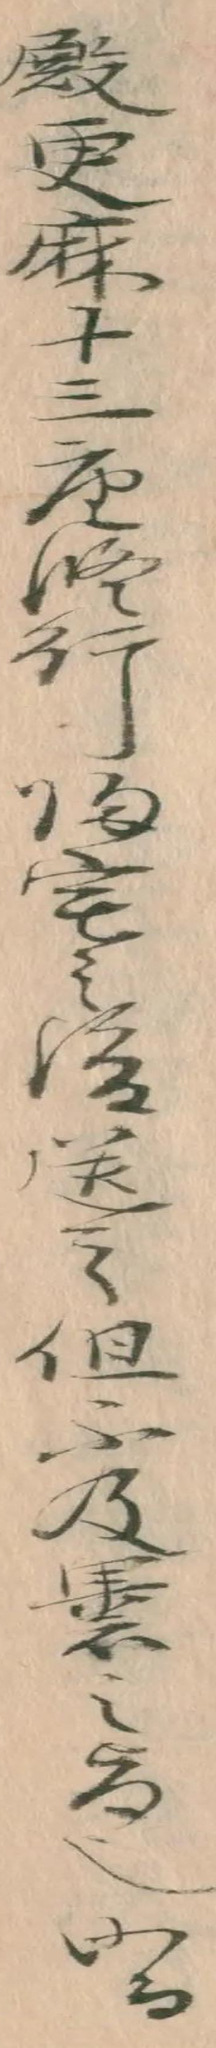殿更麻十三座修行帰宅之後送之但不及褁之旨也仍而
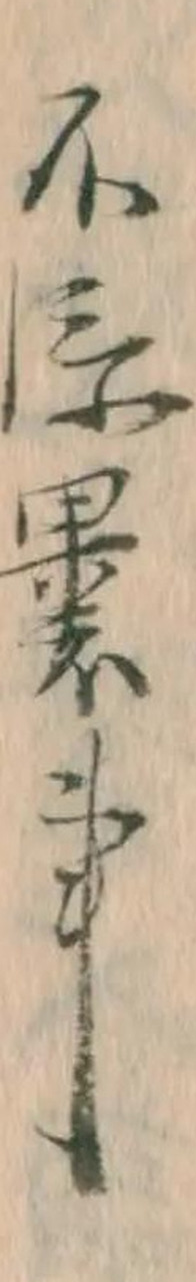不添褁事
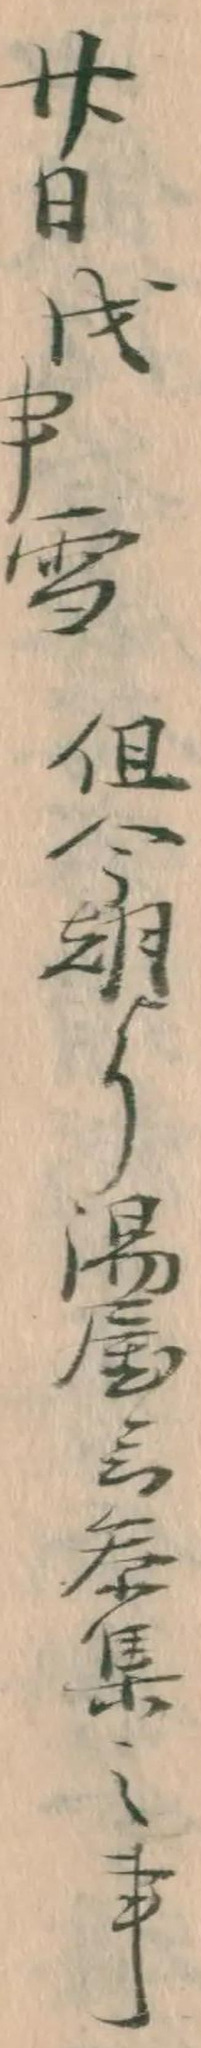廿日戊申雪但今朝より湯屋ニ而参集之事
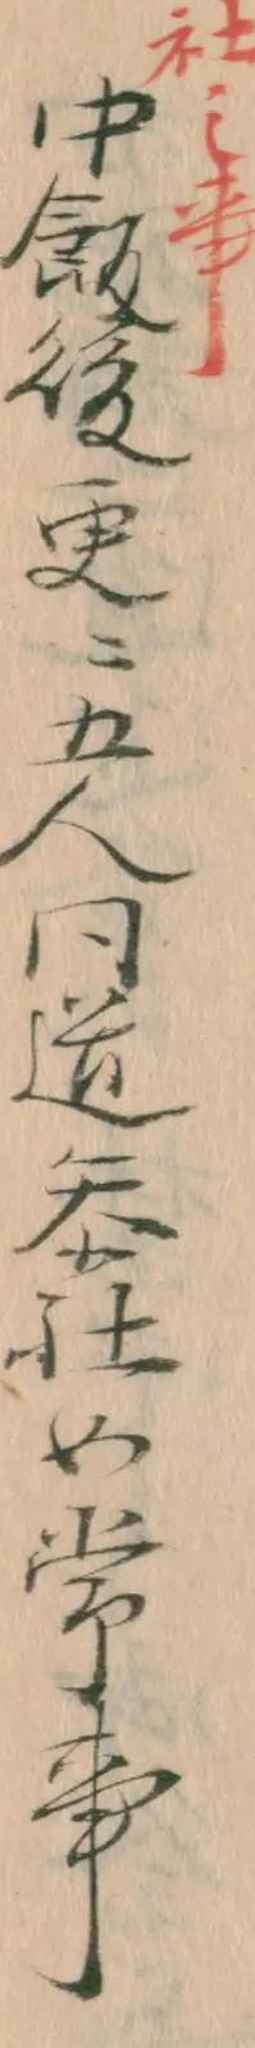一中飯後更ニ五人同道参社如常事
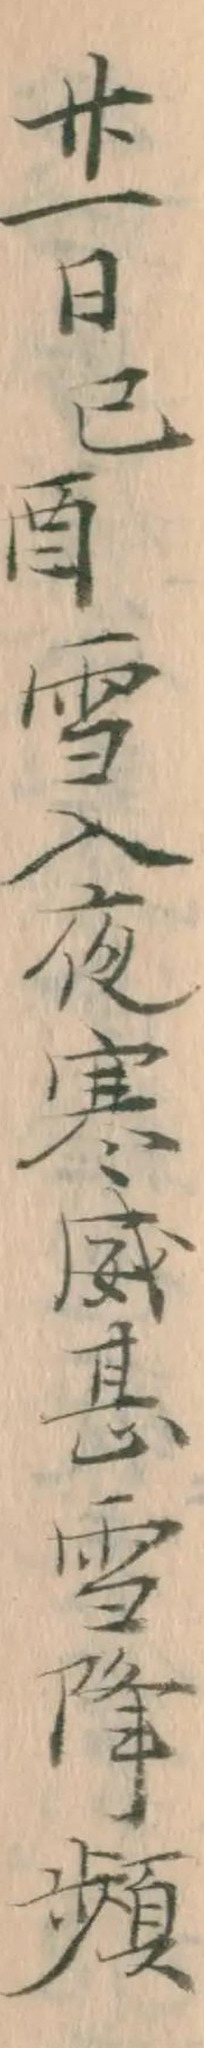廿一日己酉雪入夜寒威甚雪降頻
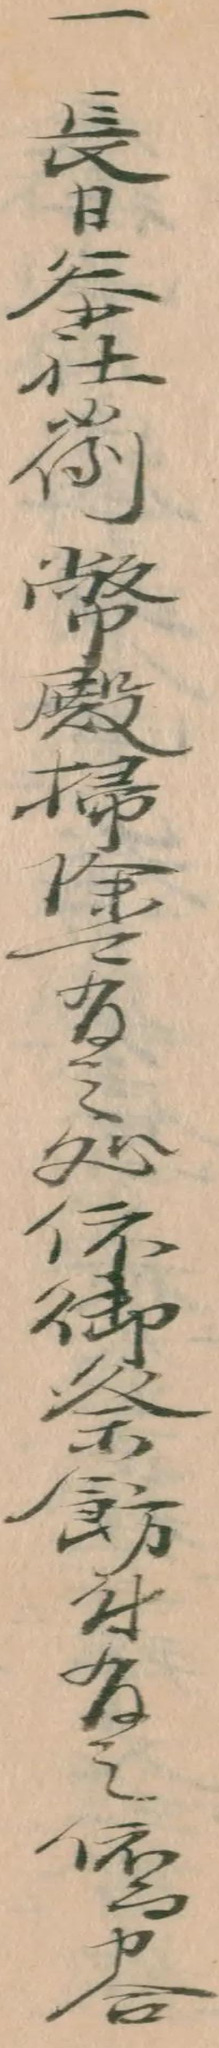一長日参社如例幣殿掃除可有之処依御祭餝付有之依而申合
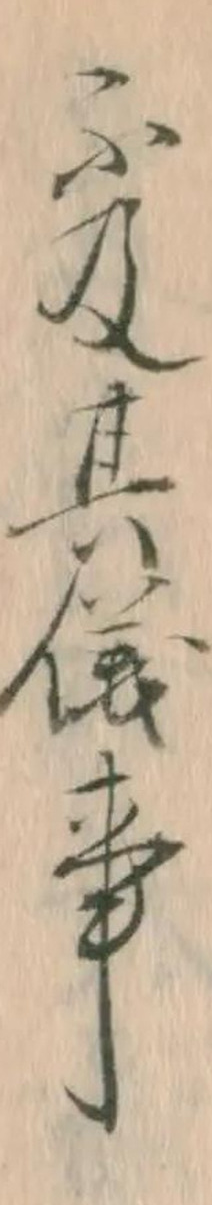不及其儀事
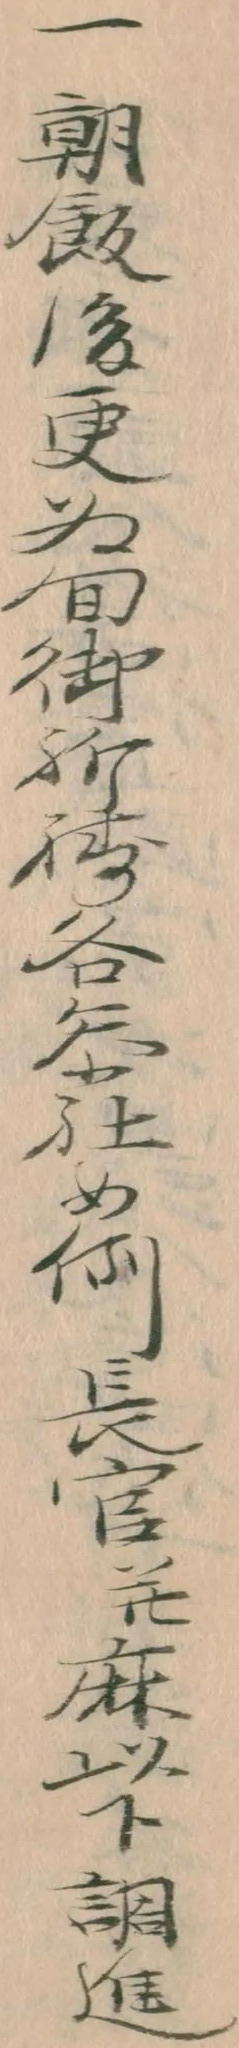一朝飯後更為旬御祈祷各参社如例長官并麻以下調進
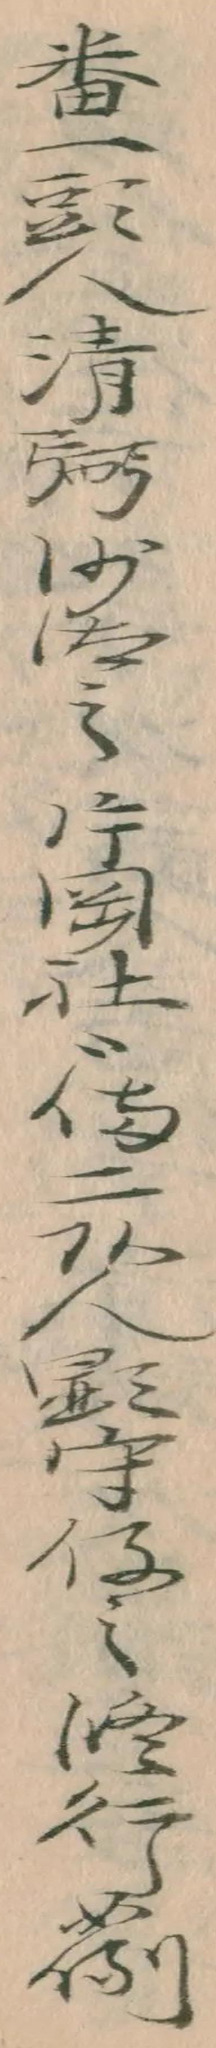番一頭人清弼沙汰之片岡社御備二弐頭人顕守役之修行如例
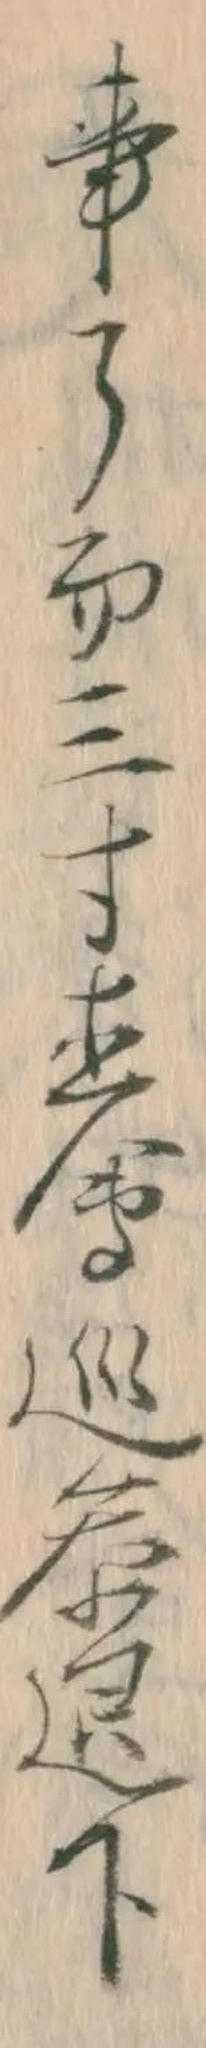事了而三寸直會巡参退下
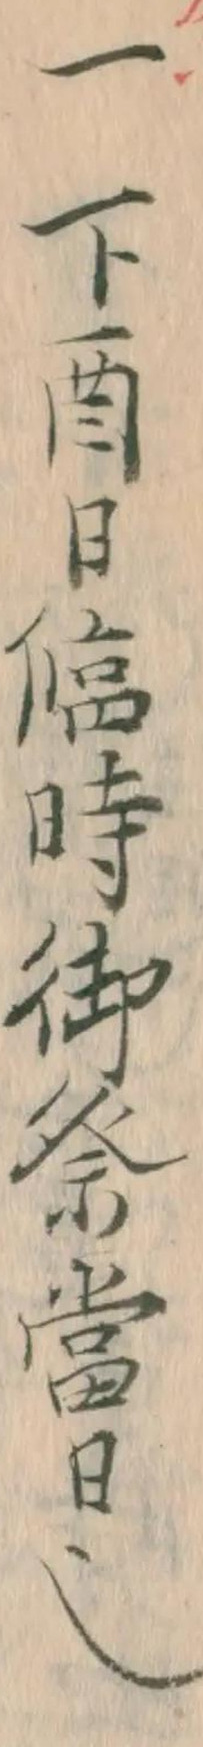一下酉日臨時御祭當日也

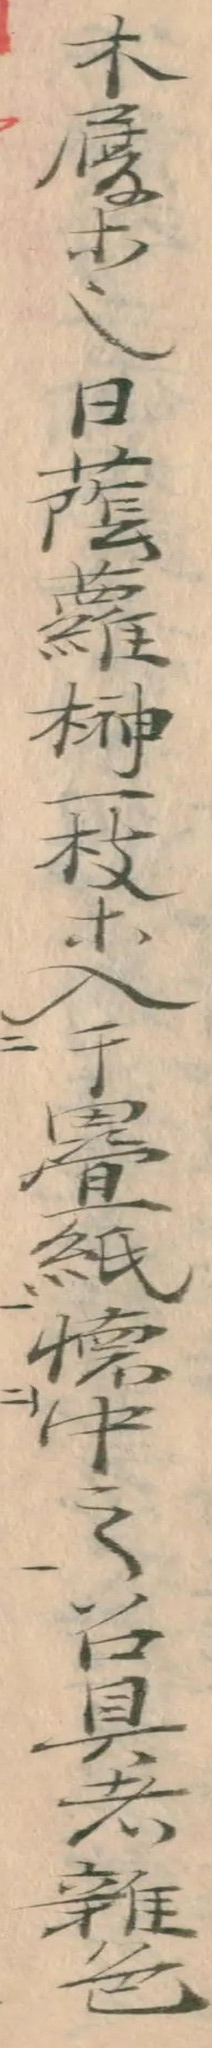木履等也日蔭蘿榊一枝等入于畳紙懐中之召具者雑色
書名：賀茂社記録. 第74冊
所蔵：国立国会図書館 National Diet Library, JAPAN
